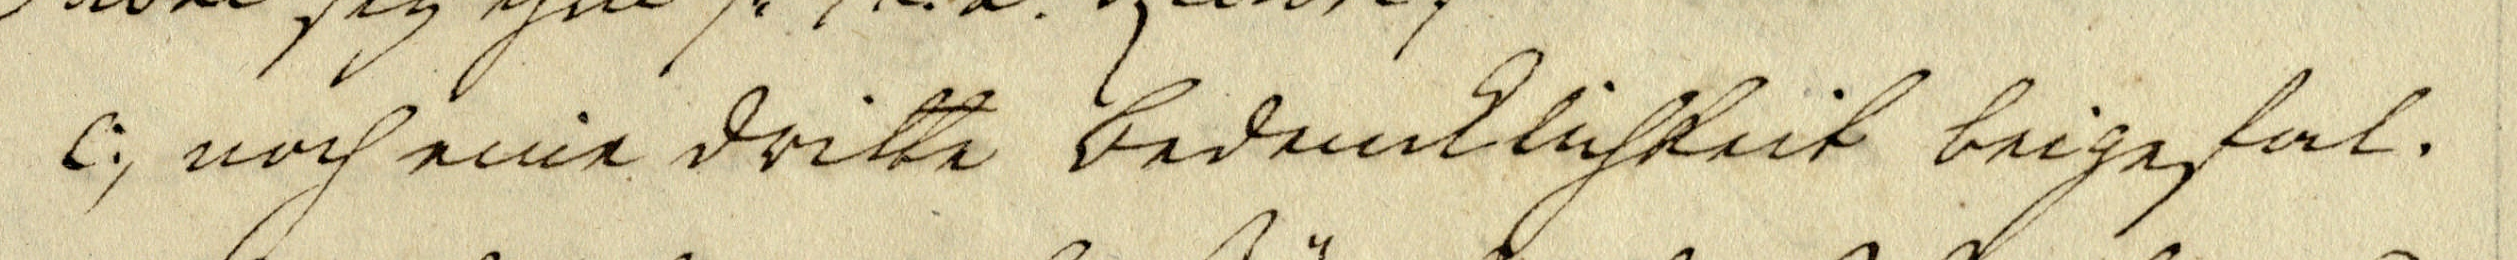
c, noch eine dritte Bedencklichkeit beigefal¬
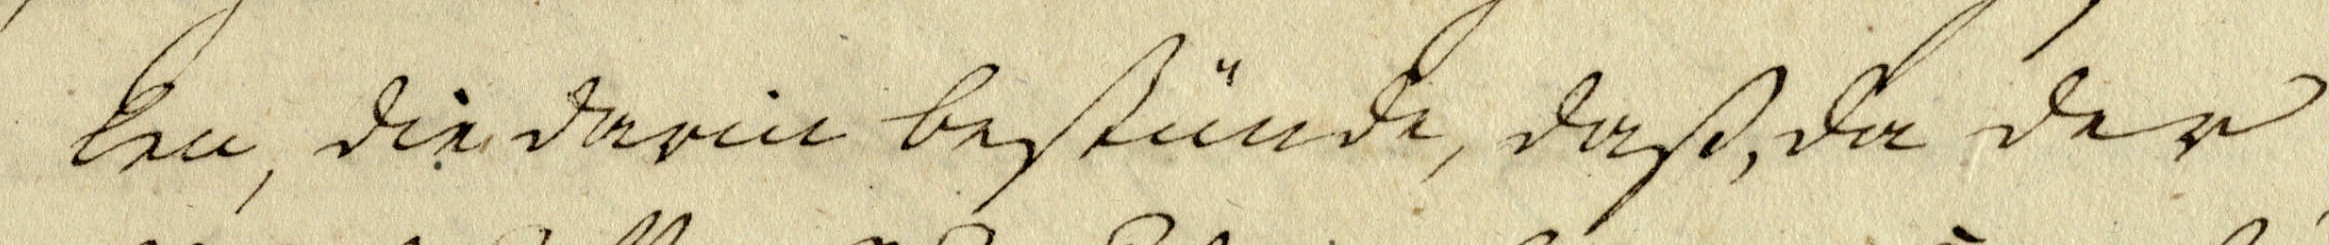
len, die darin bestünde, daß, da der
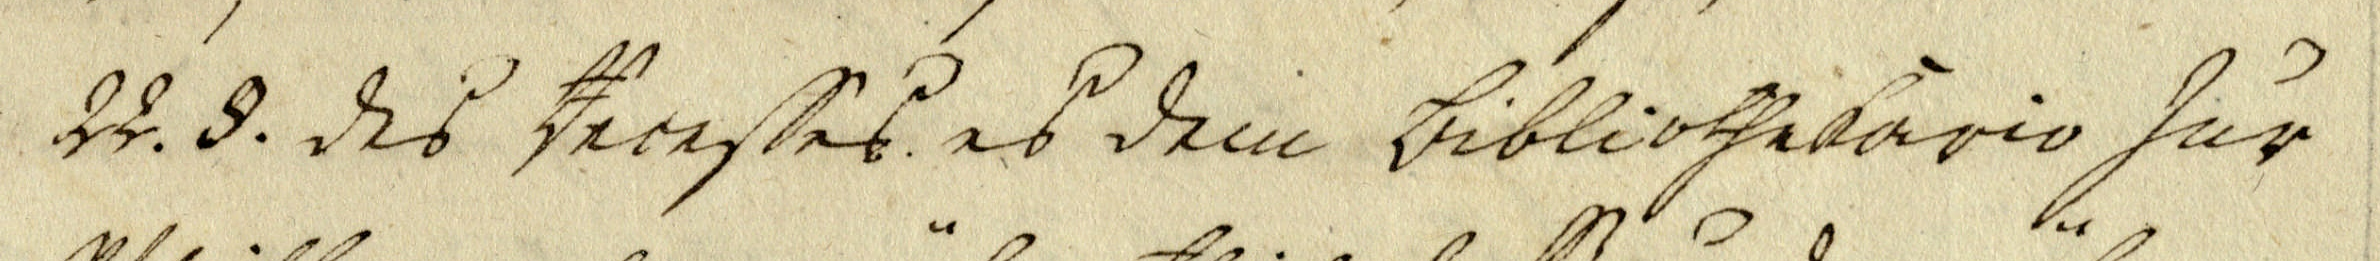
22. §. des Recesses es dem Bibliothekario zur
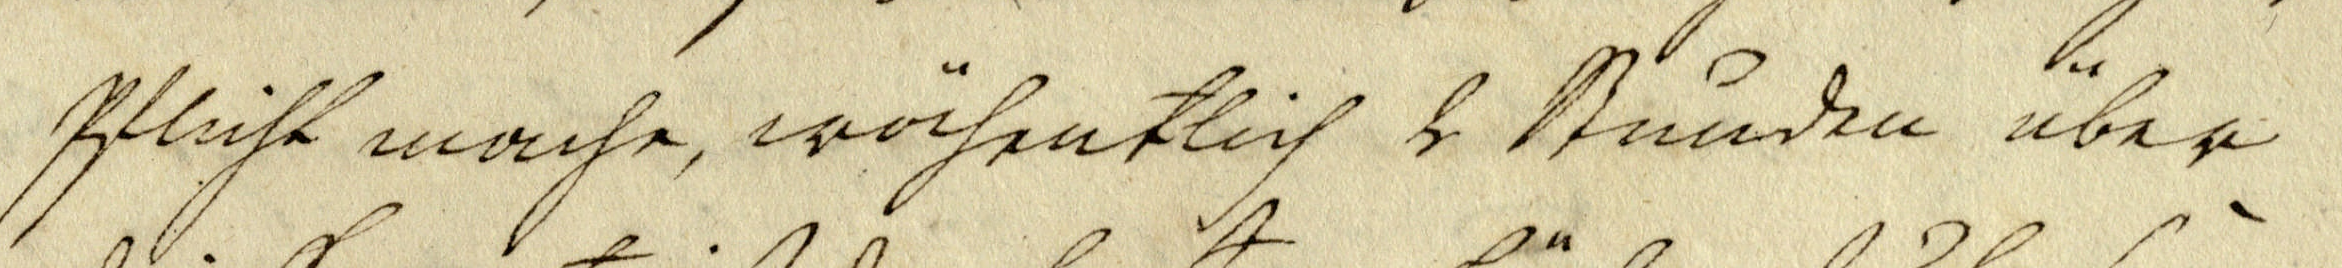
Pflicht mache, wöchentlich 2 Stunden über
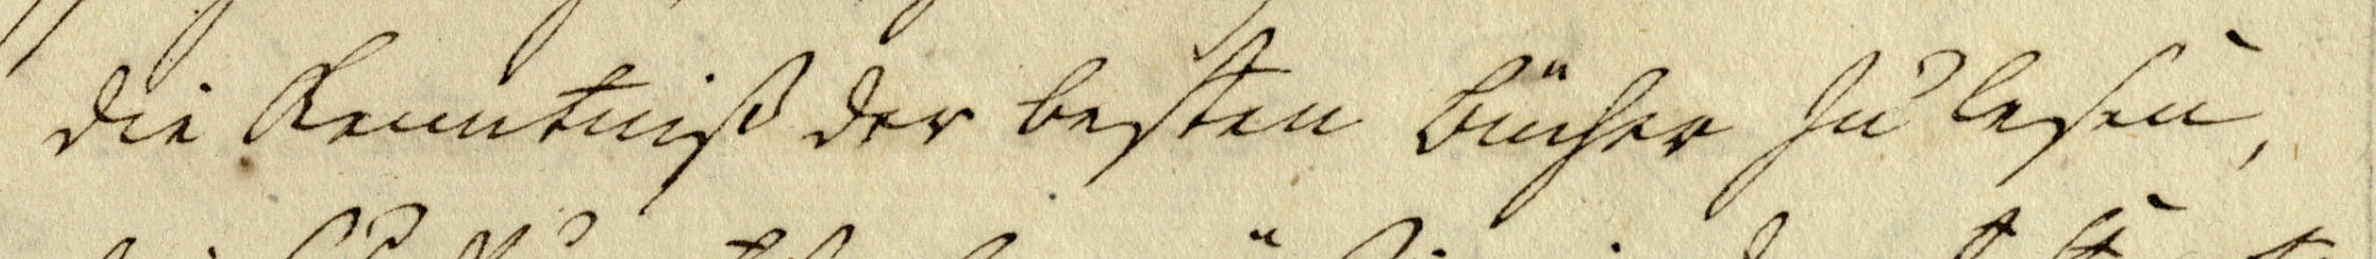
die Kenntniß der besten Bücher zu lesen,
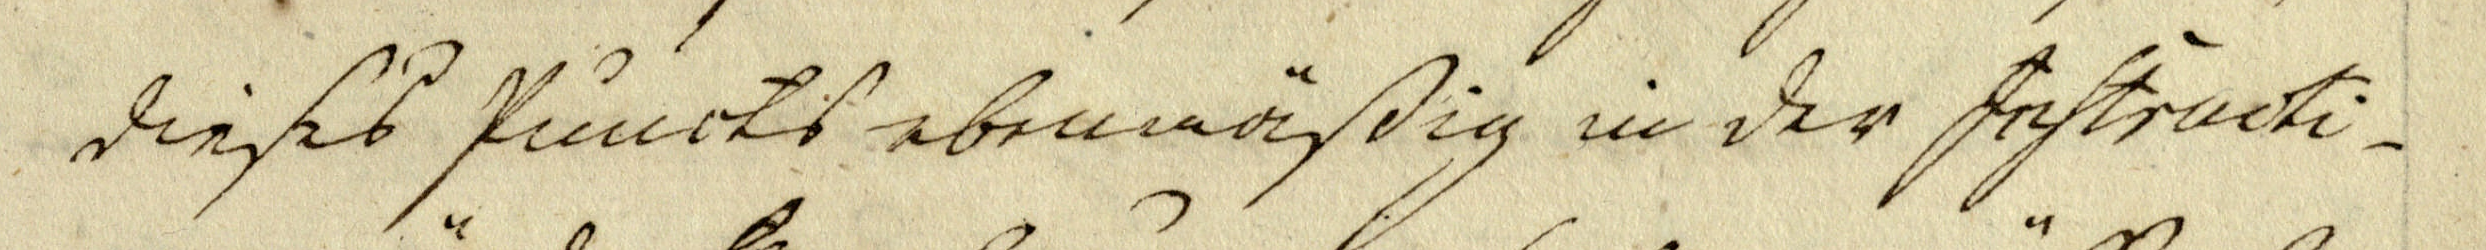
dieses Puncts ebenmäßig in der Instructi¬
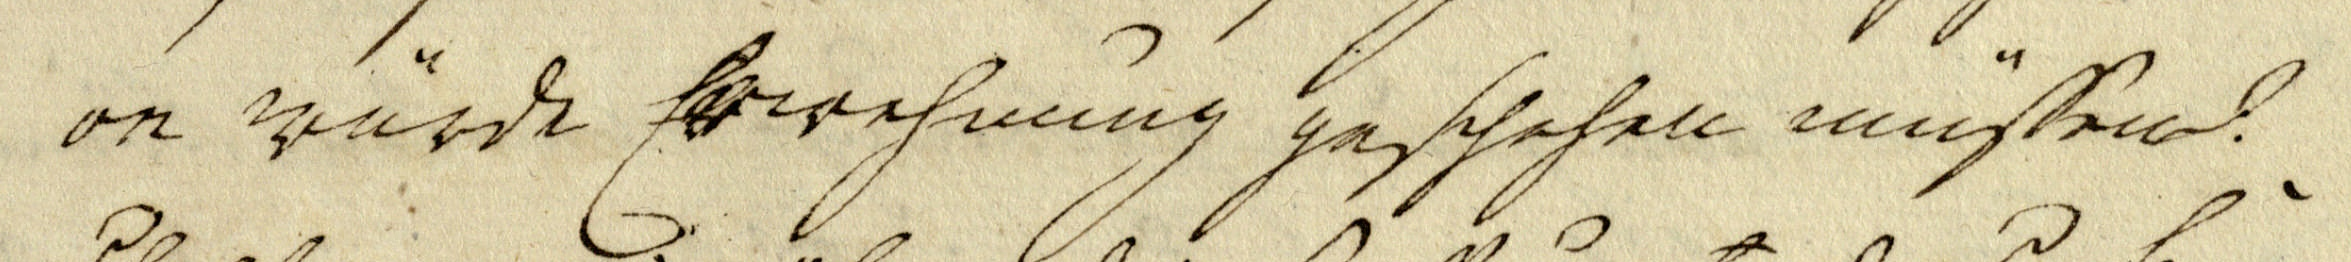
on würde Erwehnung geschehen müssen.
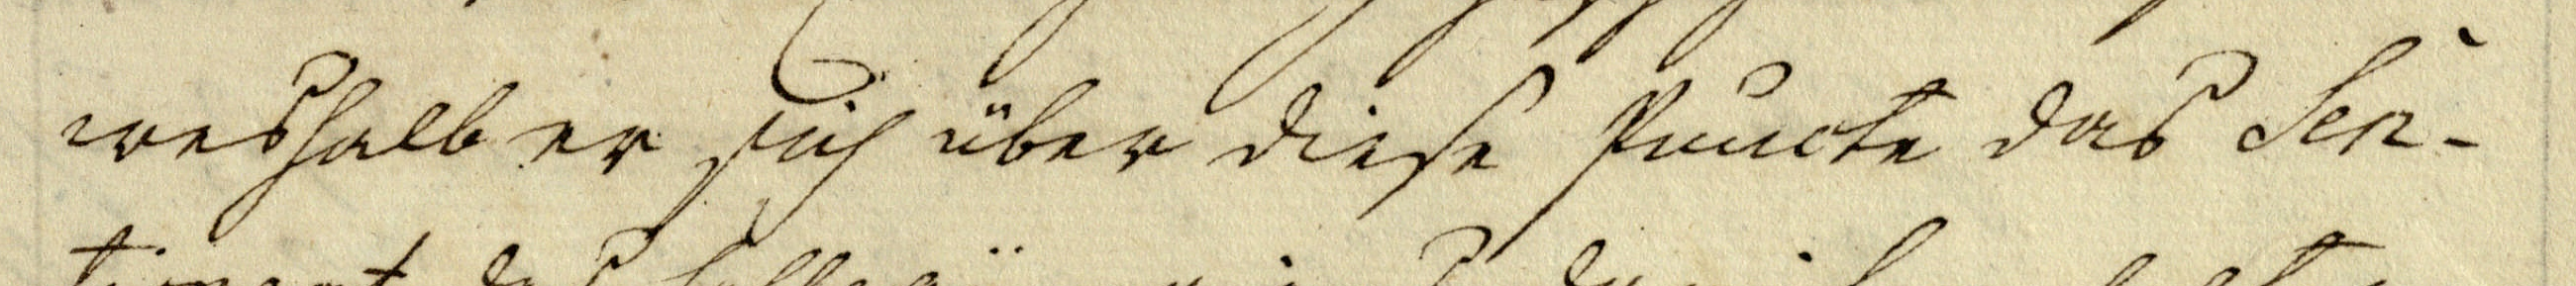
weshalb er sich über diese Puncte das Sen¬
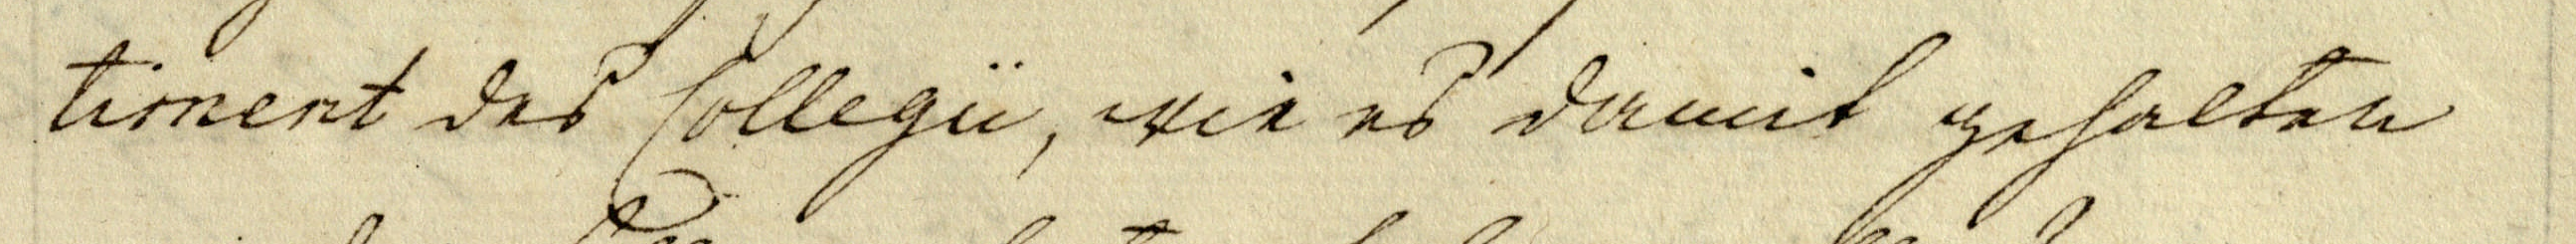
timent des Collegii, wie es damit gehalten
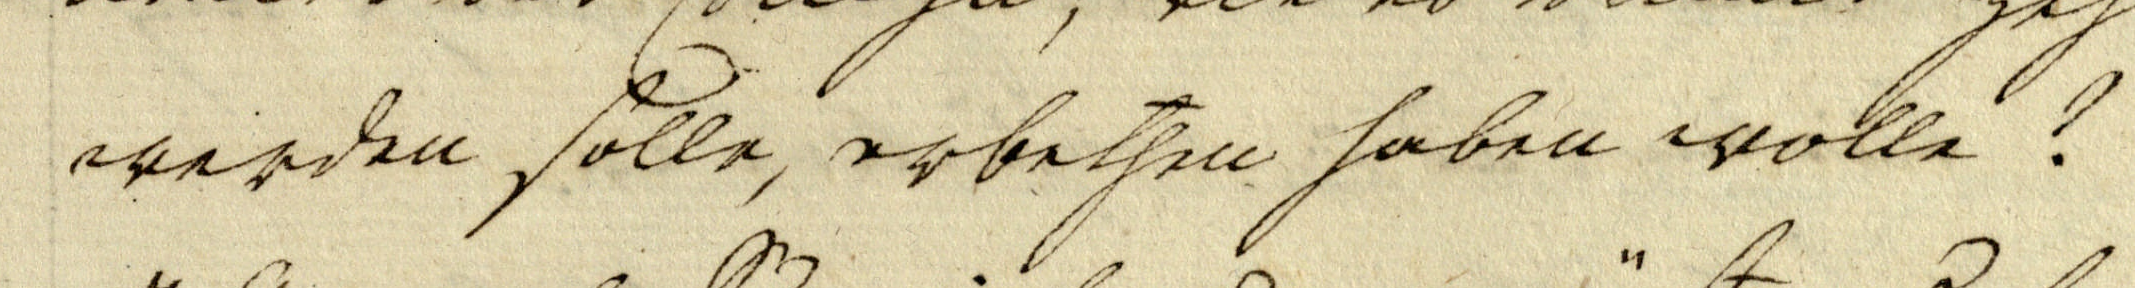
werden solle, erbethen haben wolle?
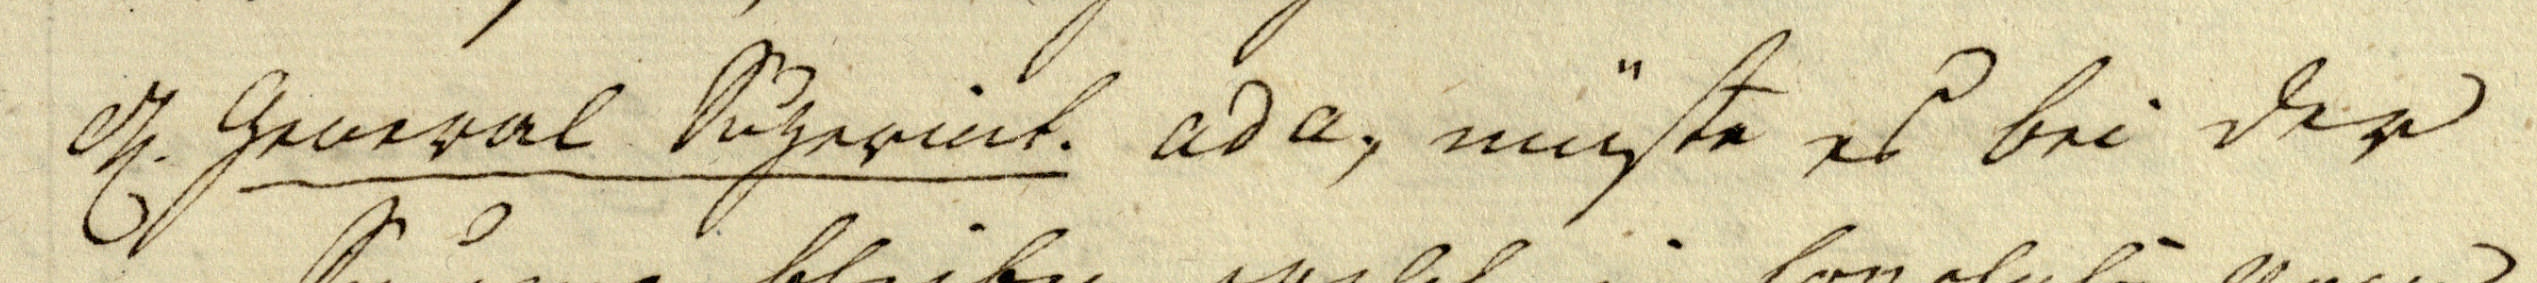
dh. General Superint. ad a. müßte es bei der
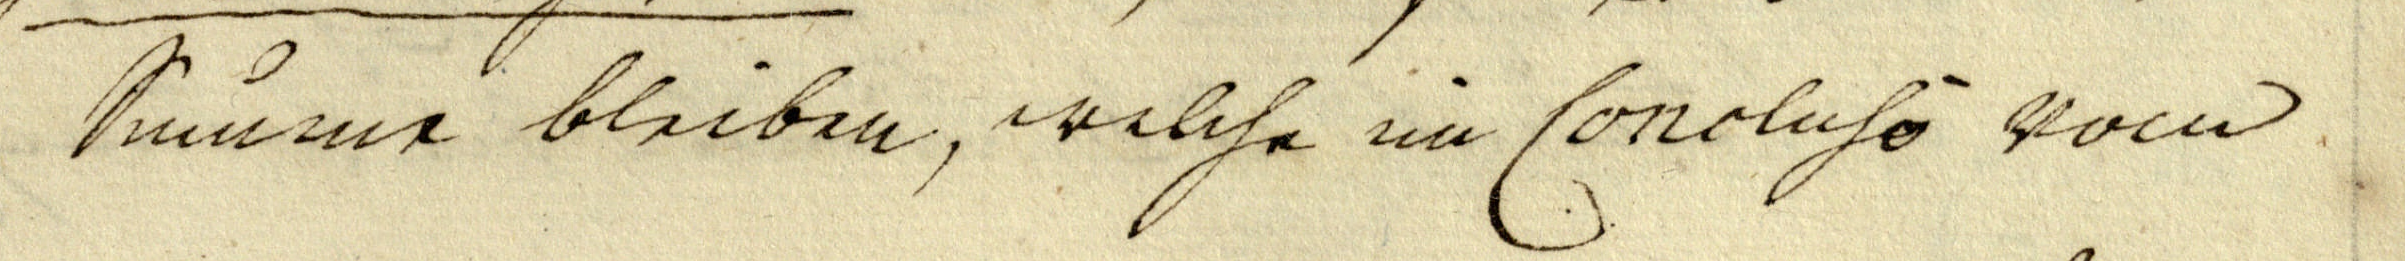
Summe bleiben, welche im Concluso vom
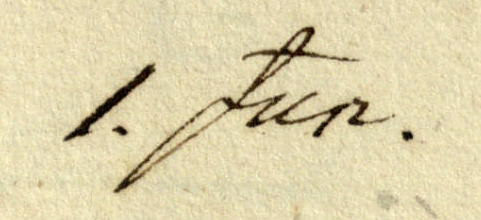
1. Jun.
